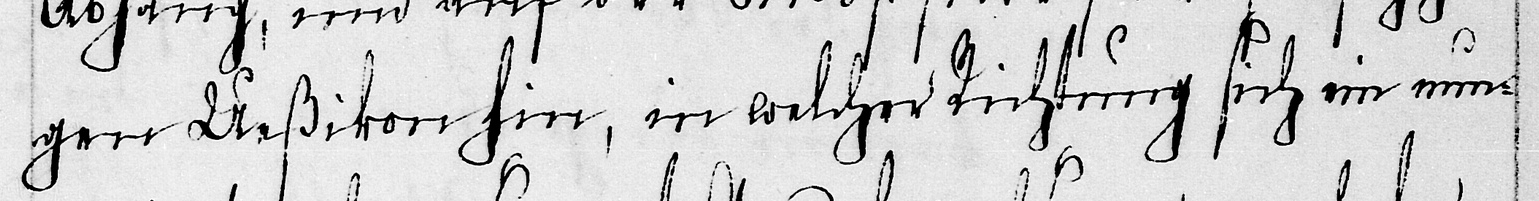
gen Ueßikon hin, in welcher Richtung sich ein nun¬
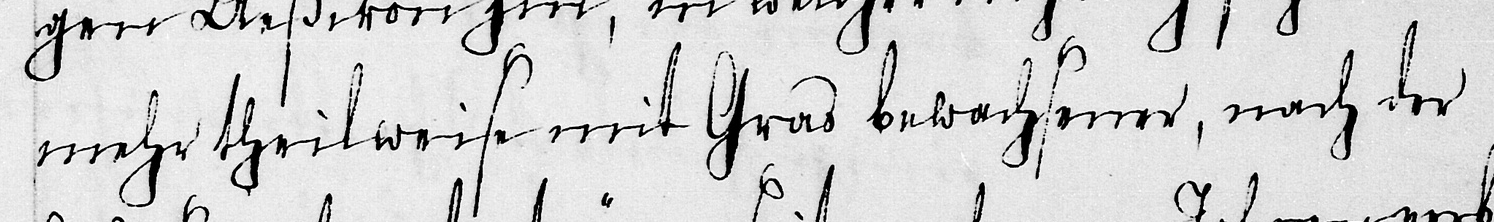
mehr theilweise mit Gras bewachsener, nach der
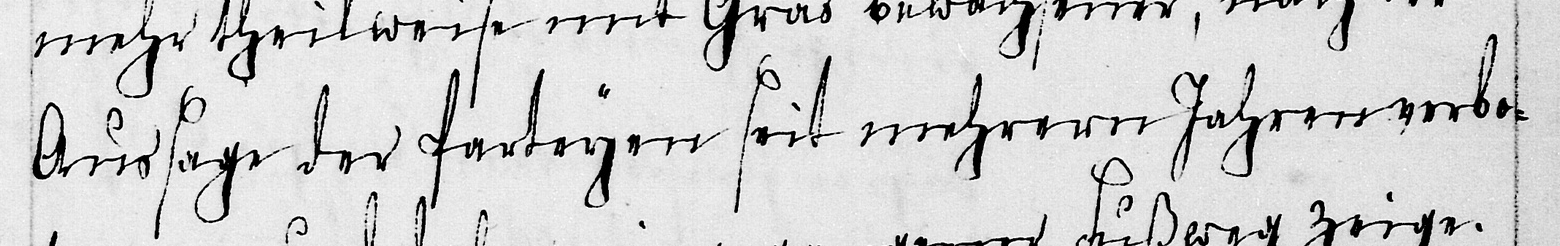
Aussage der Parteyen seit mehrern Jahren verbo¬
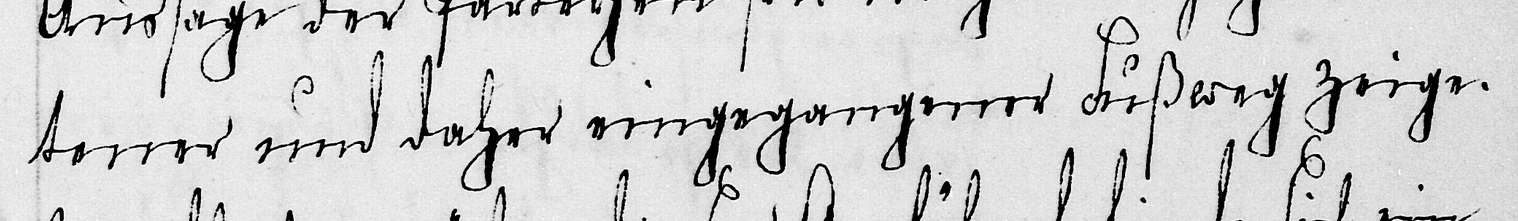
tener und daher eingegangener Fußweg zeige.
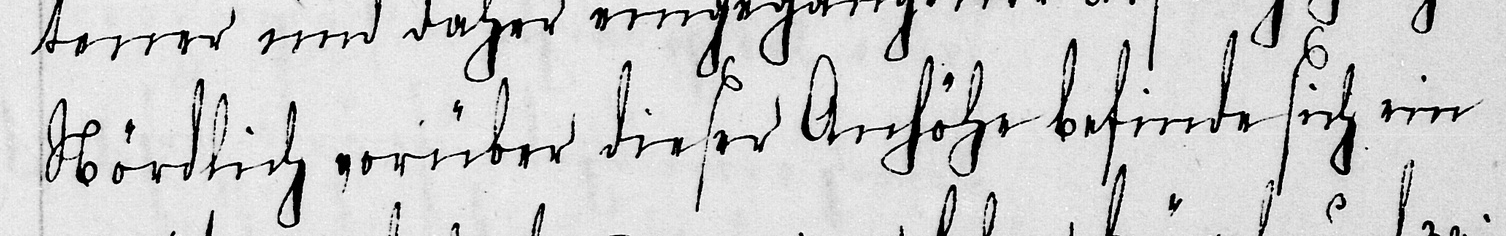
Nördlich vorüber dieser Anhöhe befinde sich ein
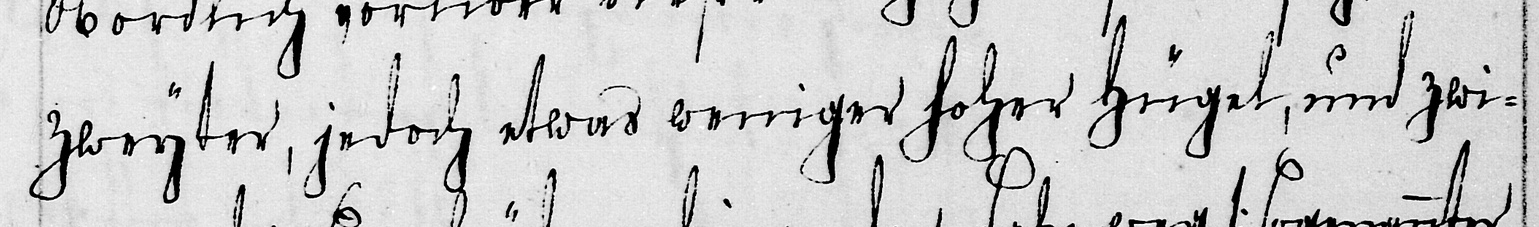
zweyter, jedoch etwas weniger hoher Hügel, und zwi¬
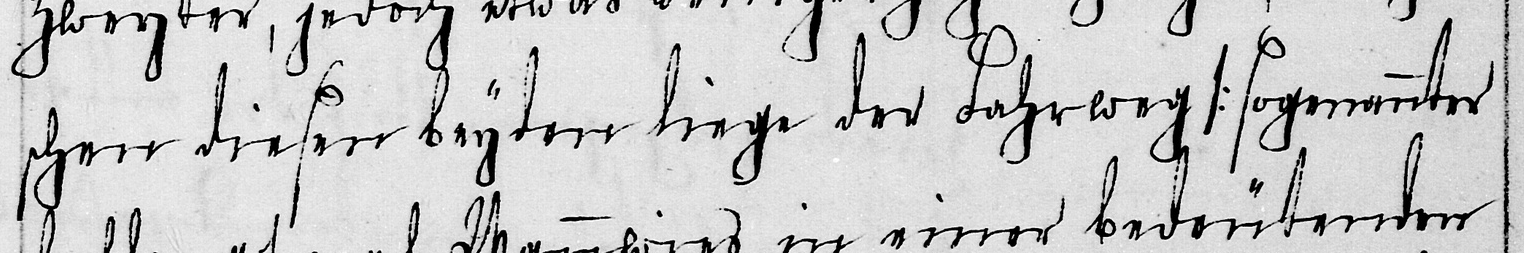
schen diesen beyden liege der Fahrweg [sogenannter
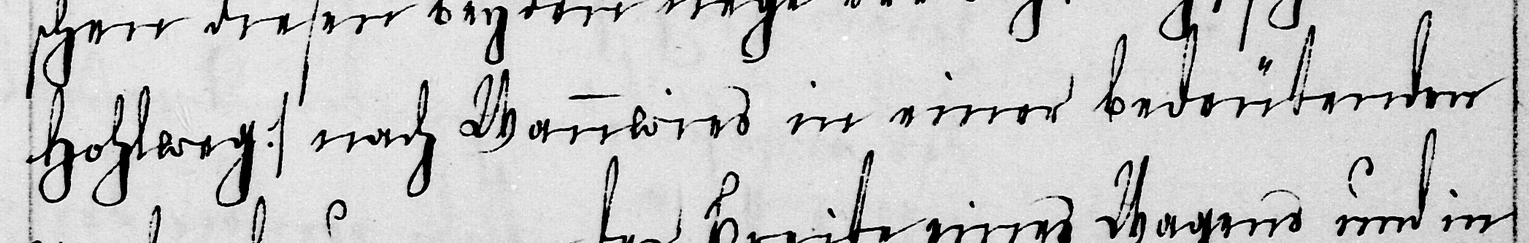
Hohlweg] nach Wannwies in einer bedeutenden
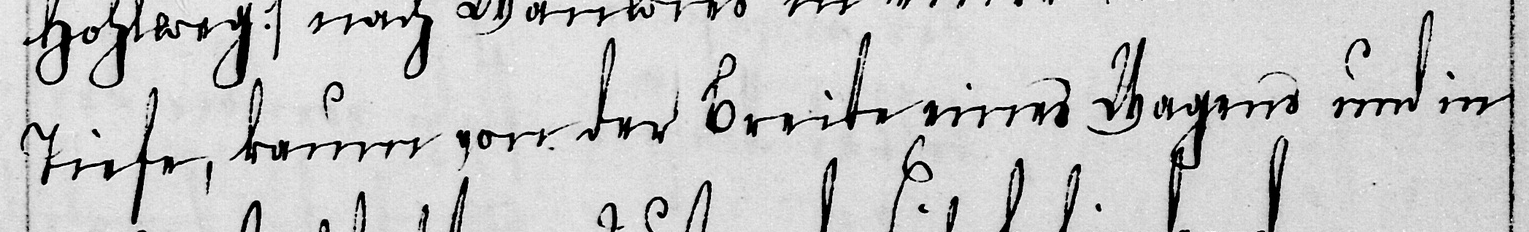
Tiefe, kaum von der Breite eines Wagens und in
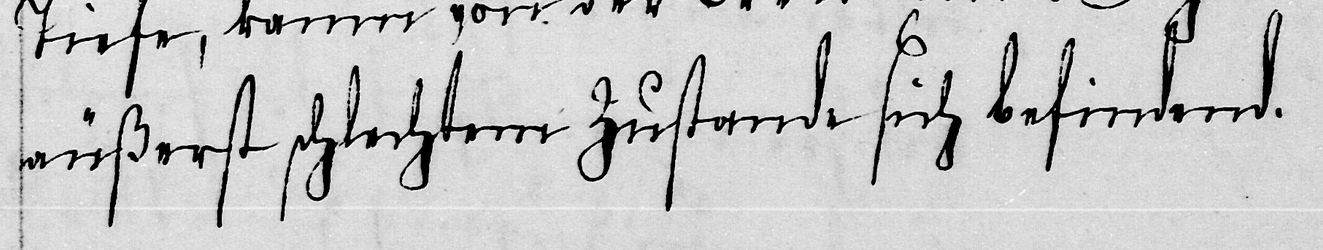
äußerst schlechtem Zustande sich befindend.
